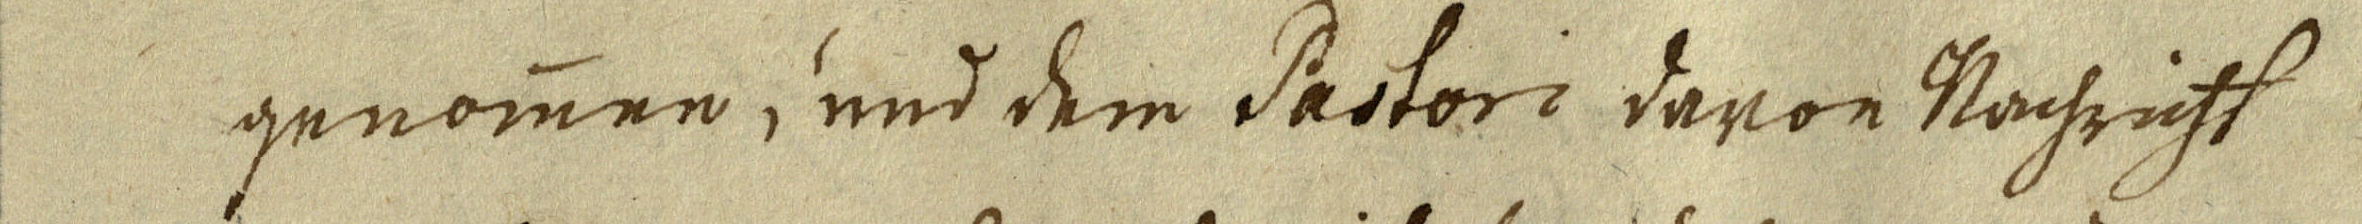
genomen, und dem Pastori davon Nachricht
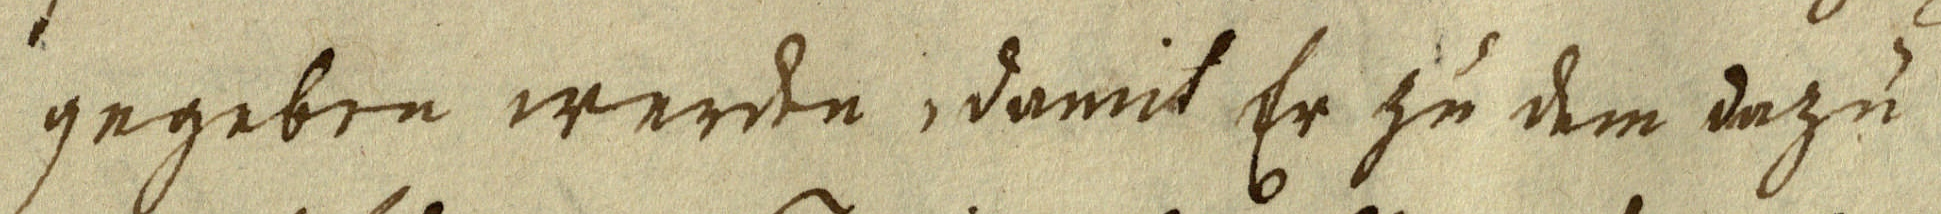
gegeben werden, damit Er zu dem dazu
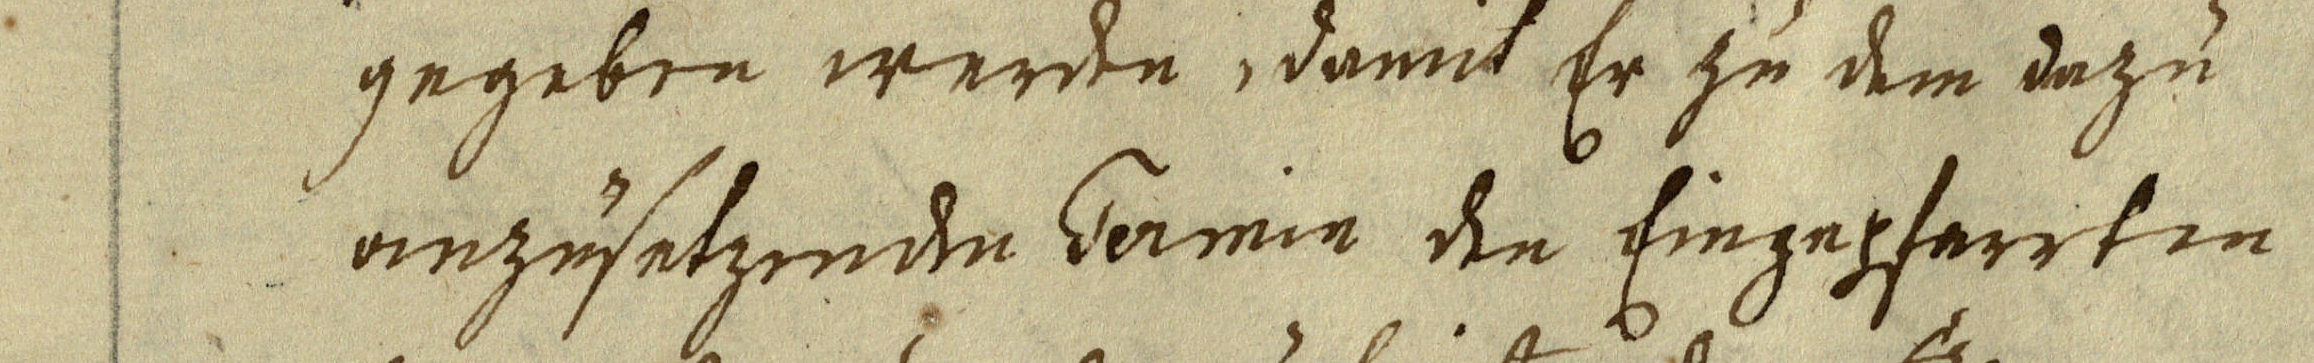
anzusetzenden Termin den Eingepfarrten
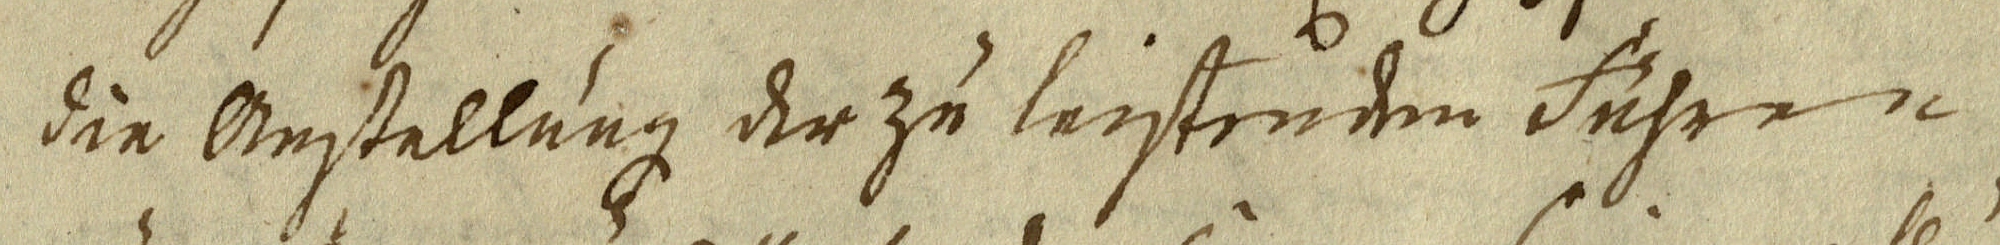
die Anstellung der zu leistenden Fuhren
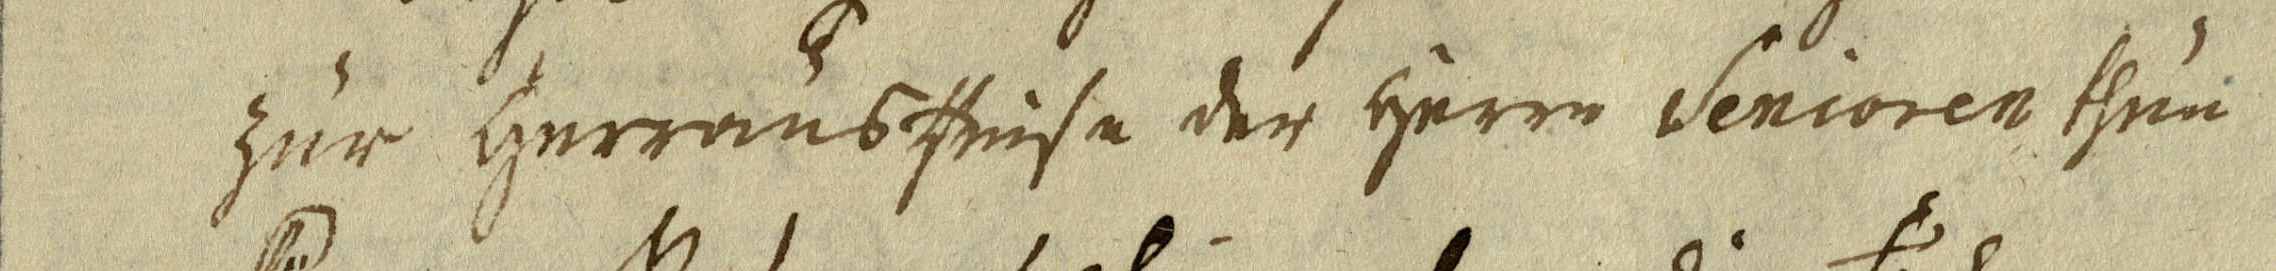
zur HerrausReise der Herrn Senioren thun
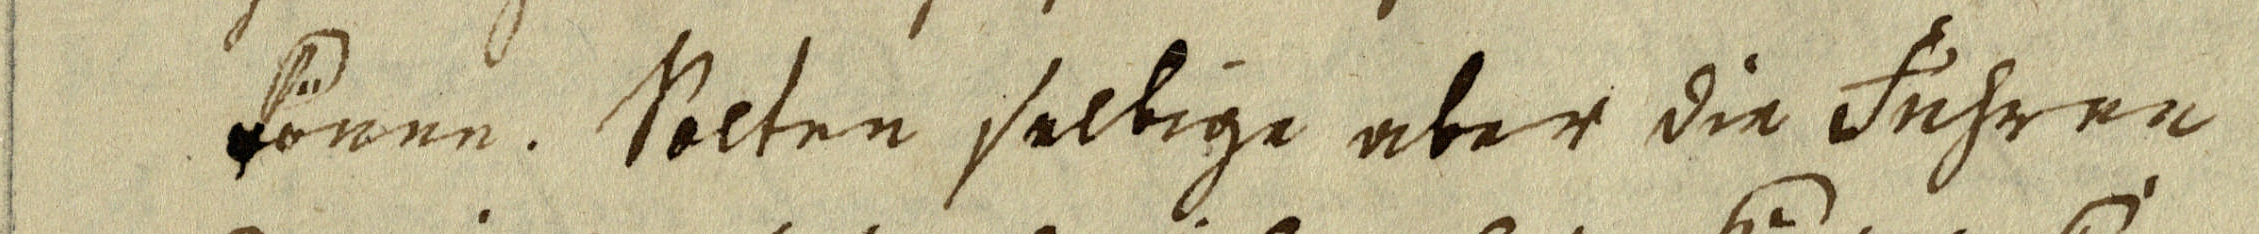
könne. Solten selbige aber die Fuhren
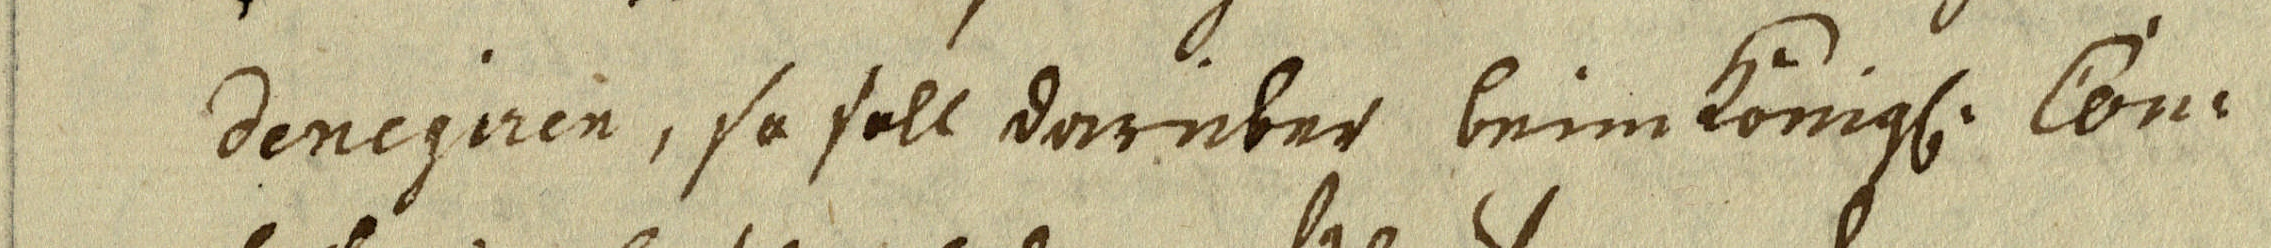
denegiren, so soll darüber beim Königl. Con¬
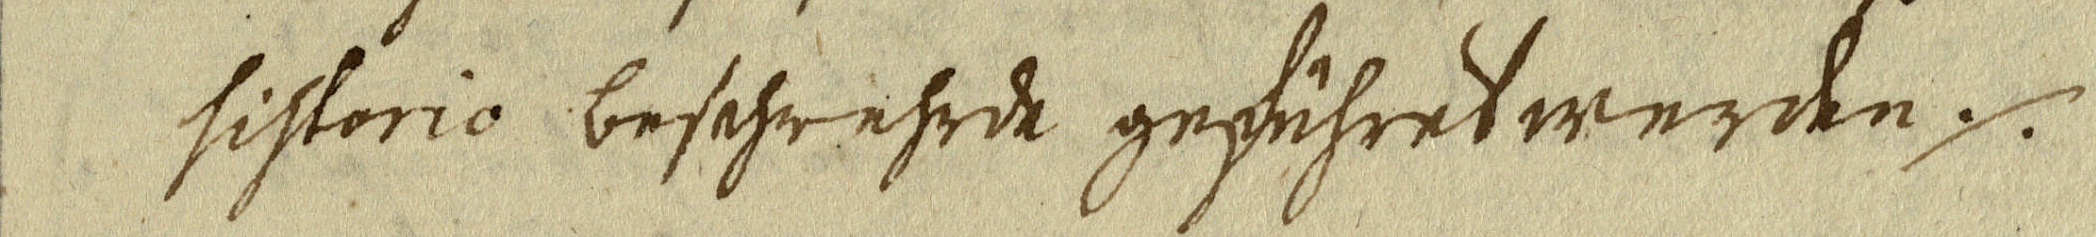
sistorio Beschwehrde geführet werden.
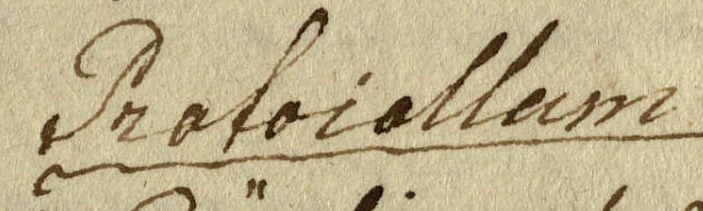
Protocollum
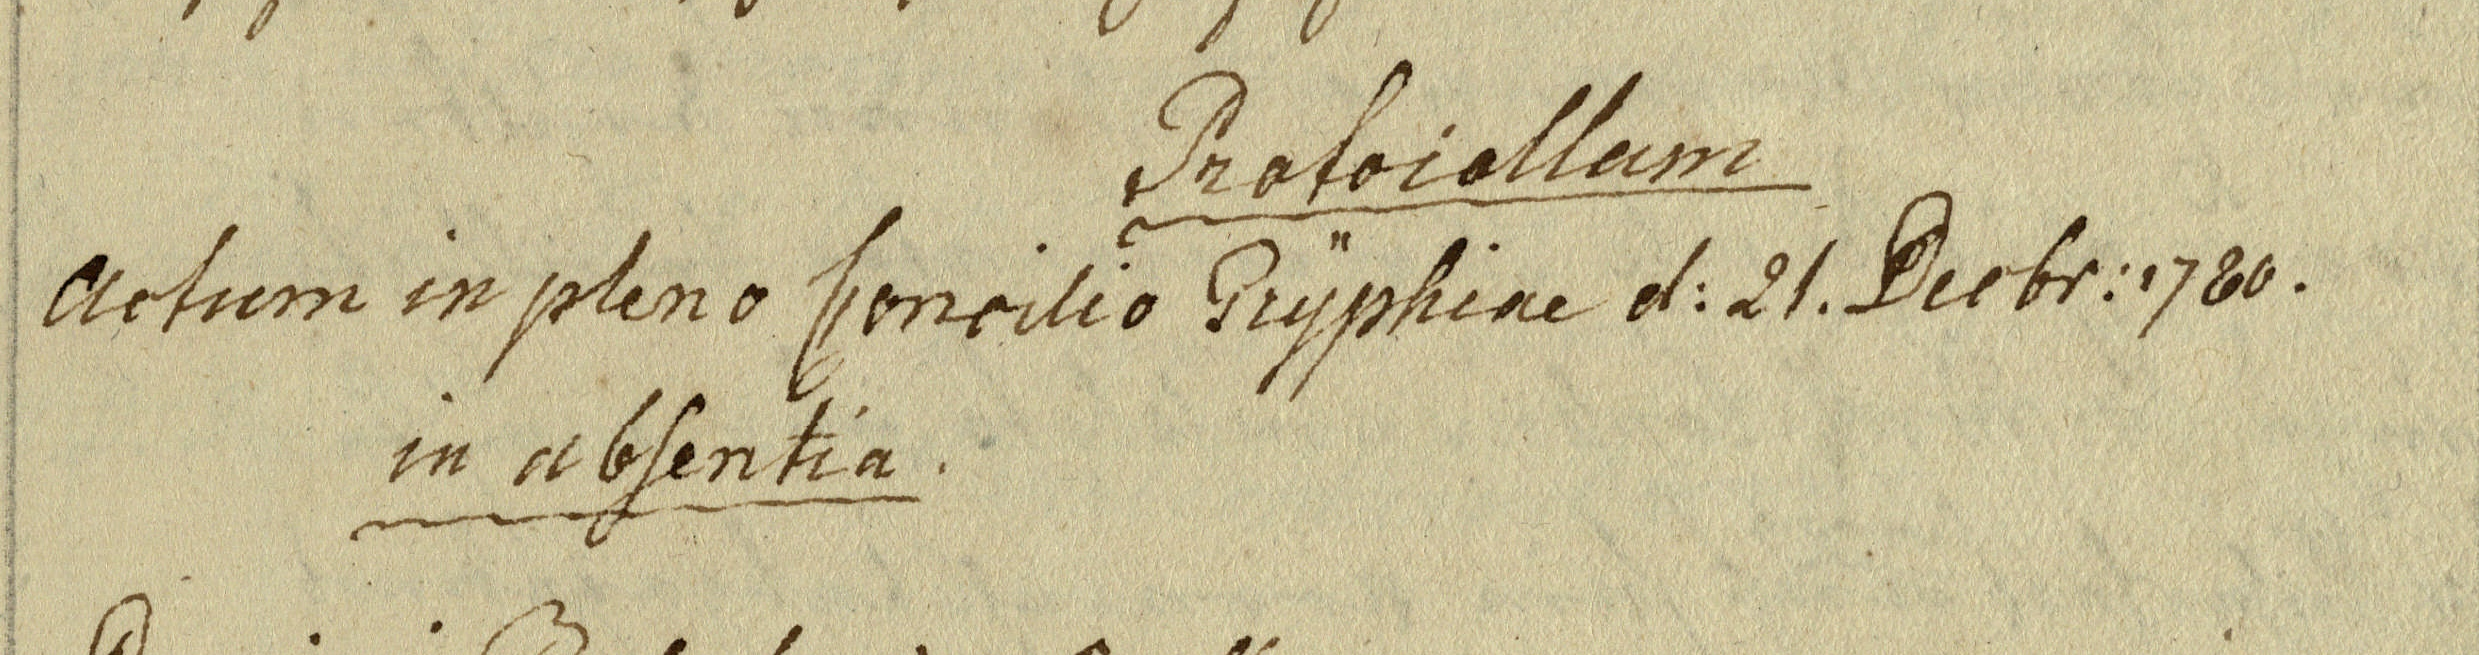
Actum in pleno Concilio Grÿphiae d. 21. Decbr. 1780.
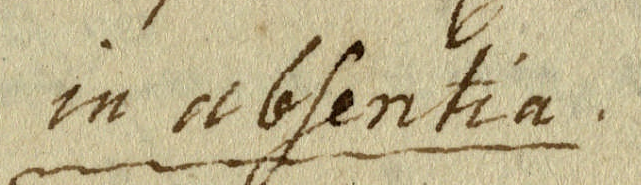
in absentia
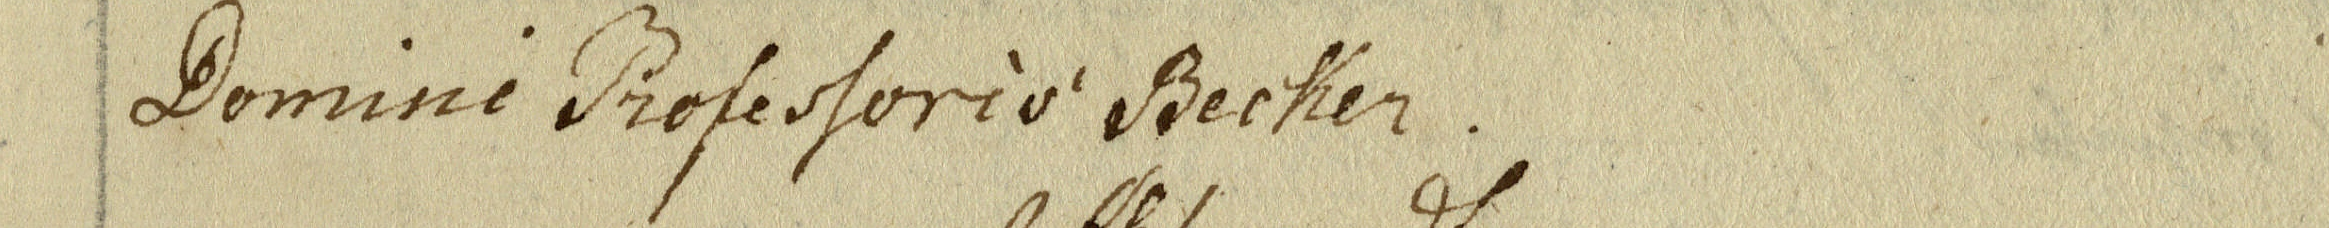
Domini Professoris Becker.
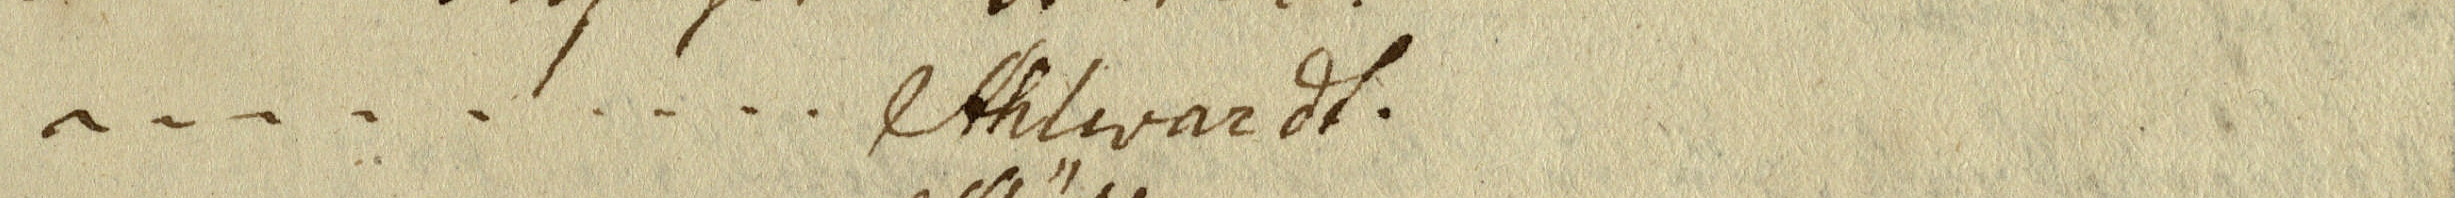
Ahlwardt.
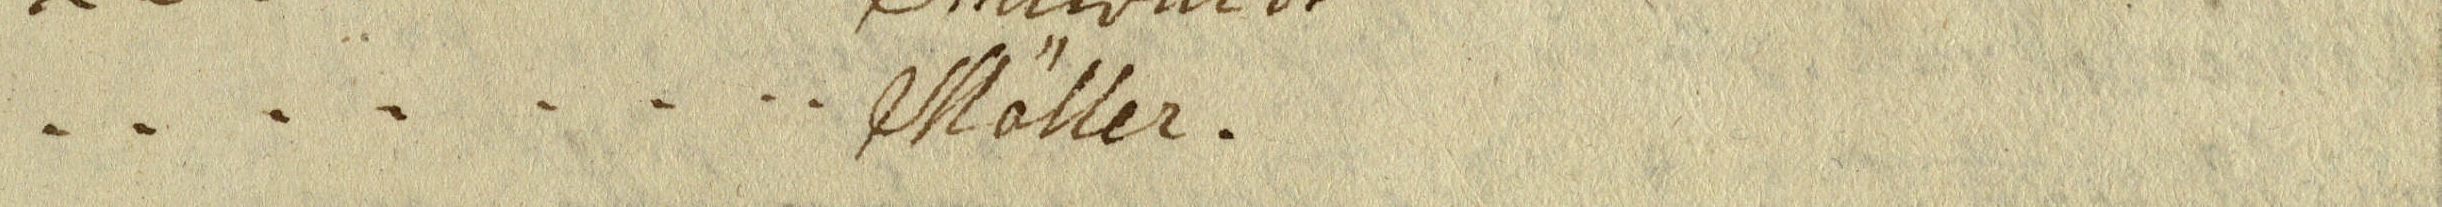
Möller.
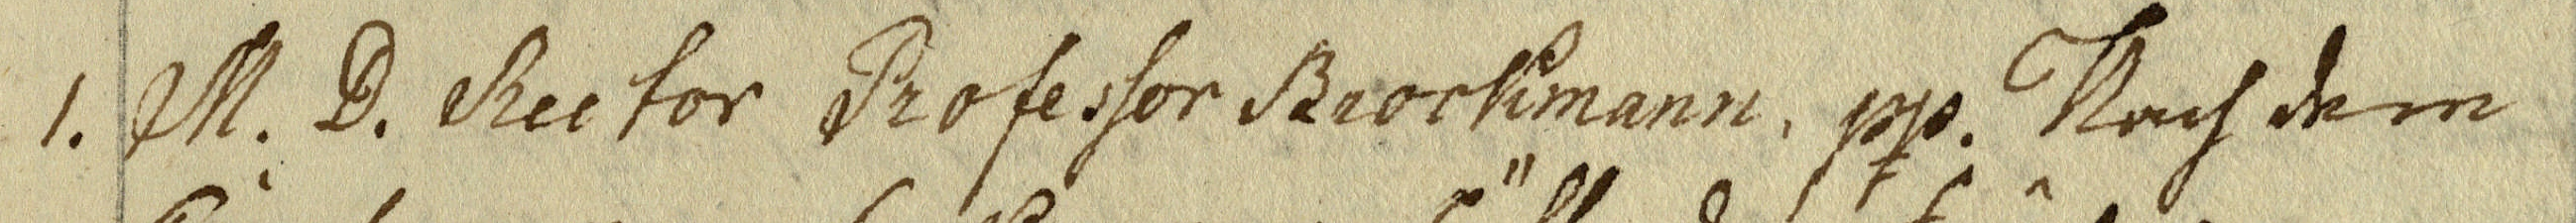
1. M. D. Rector Professor Brockmann pp. Nach dem
